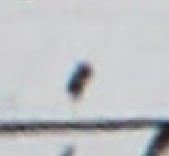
„
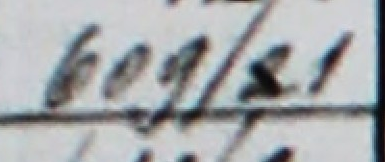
609/1
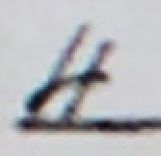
4
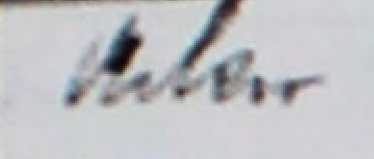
Acker
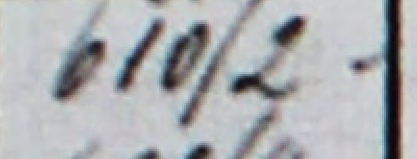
610/2
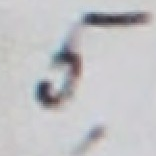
5
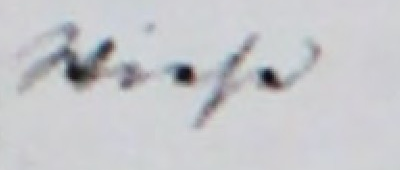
Wiese
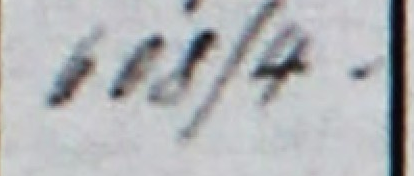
608/4
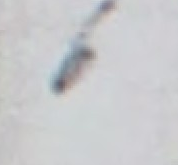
6
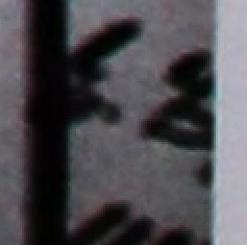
6. 8.
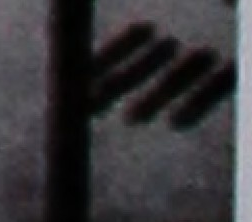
1111
